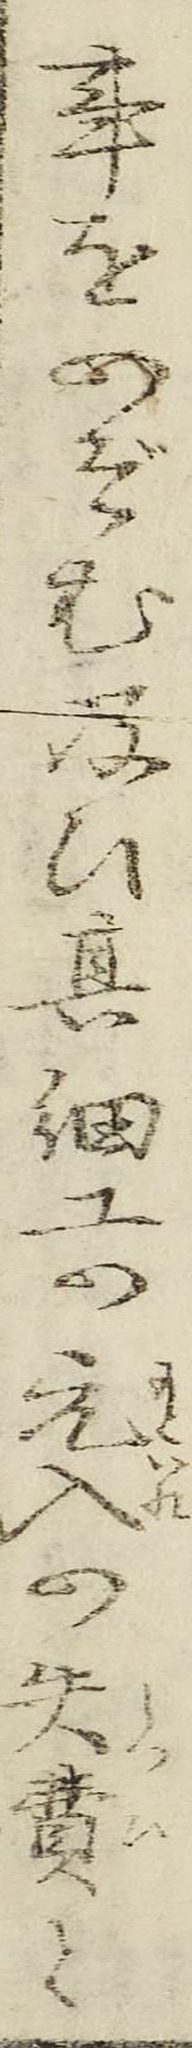事をのぞむ及ひ其細工の元入の失費と

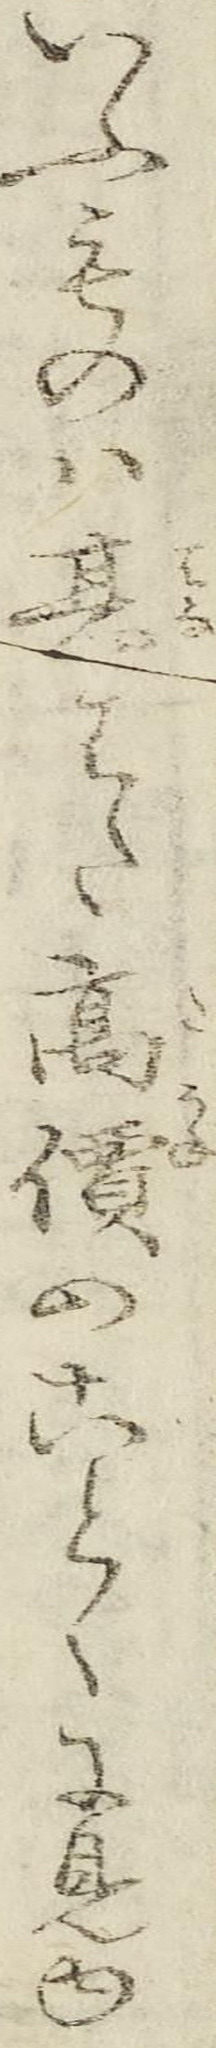いふものは甚はた高価のことくに見ゆ
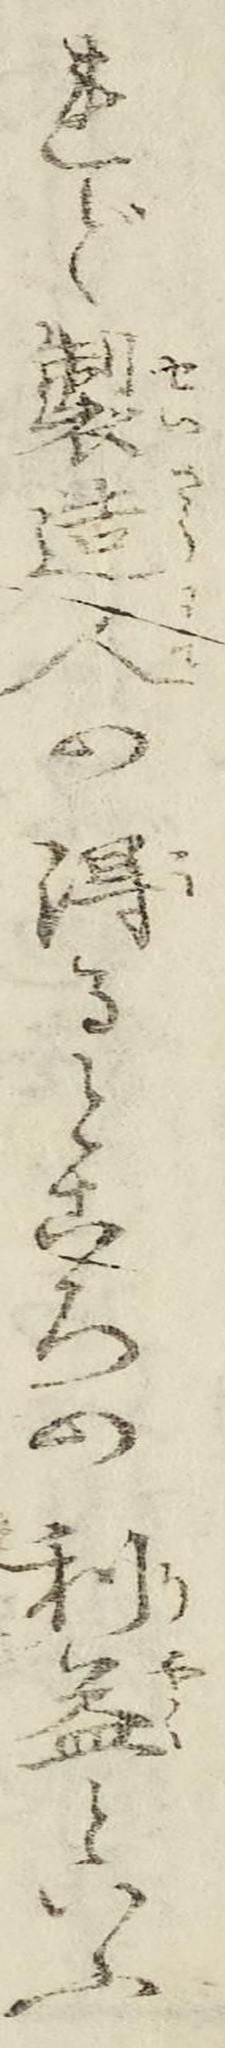れど製造人の得るところの利益といふ
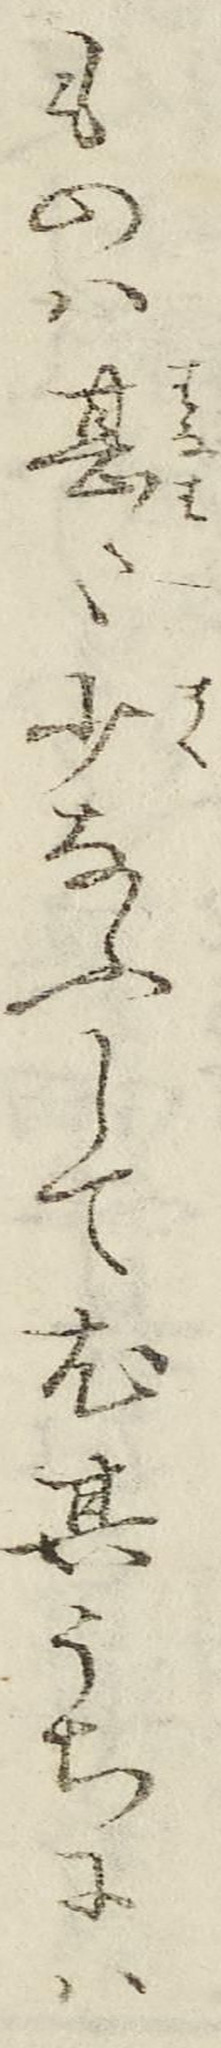ものは甚た少なふして尤其うちには
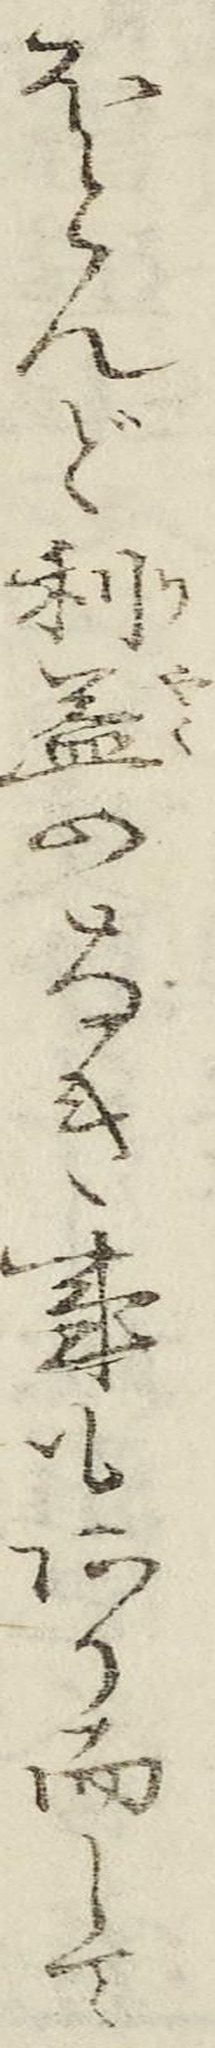ほとんど利益のなき事もあり而して
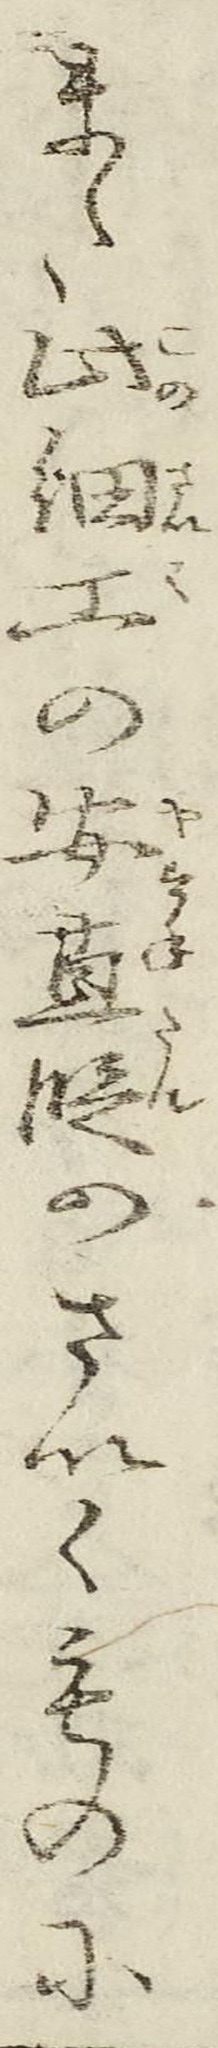また此細工の安直段のさいくものに
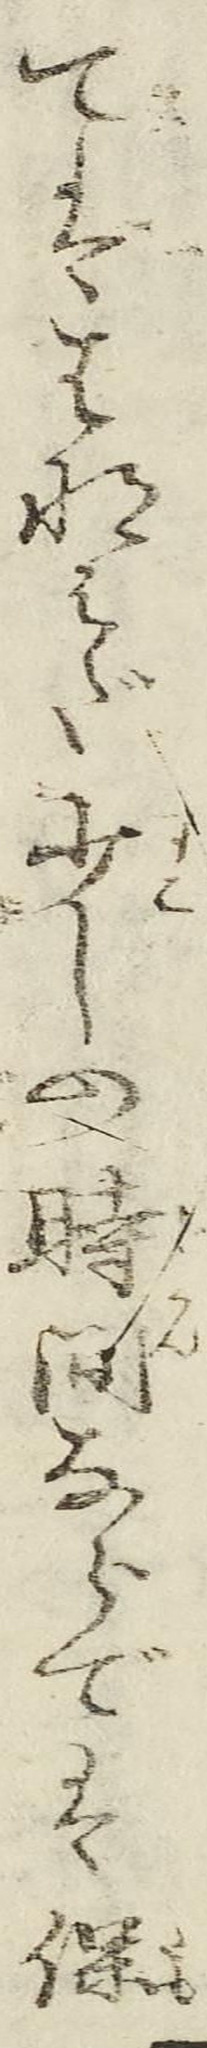てははなはだ少しの時間ならでは保
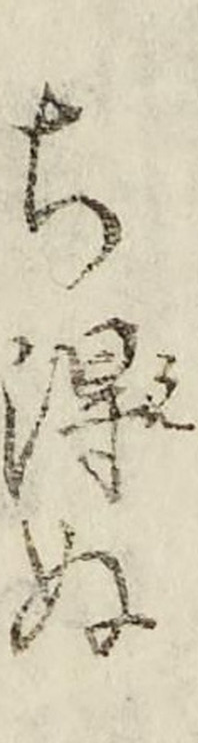ち得ぬ
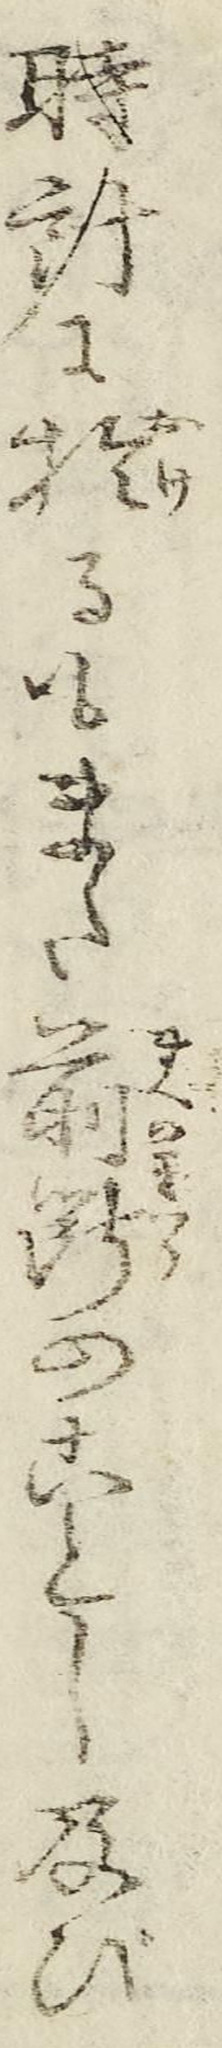時計に於るもまた前断のことし及び
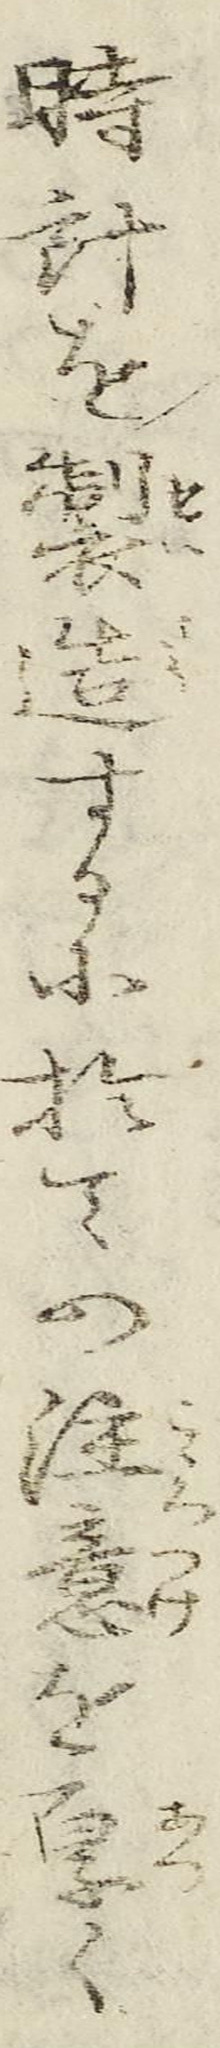時計を製造するに於ての注意を厚く
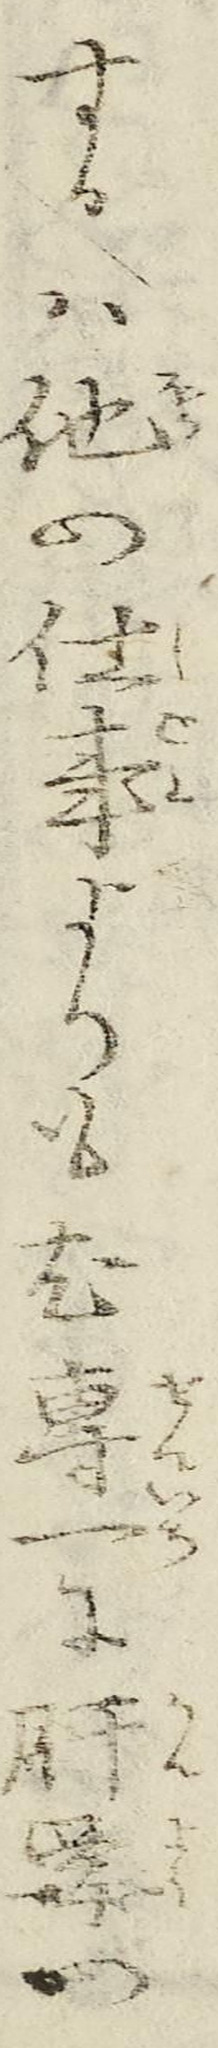するは他の仕事よりも尤専一に肝要の
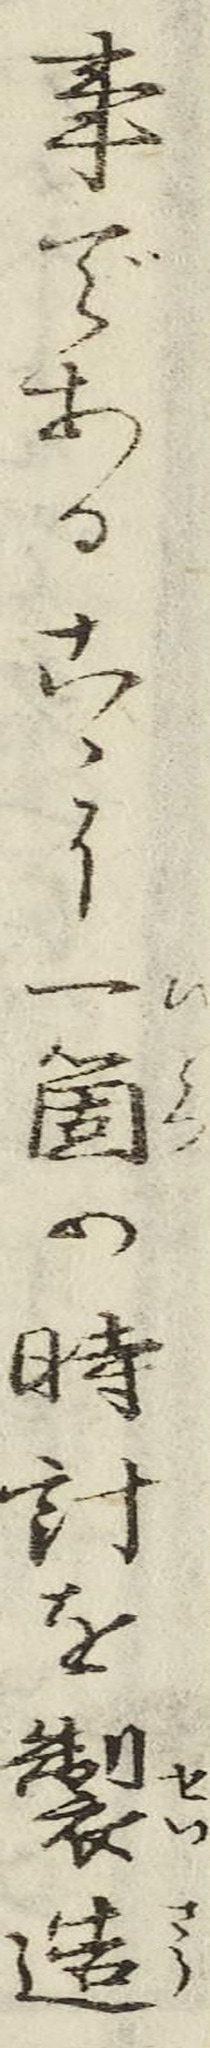事であるこゝに一箇の時計を製造
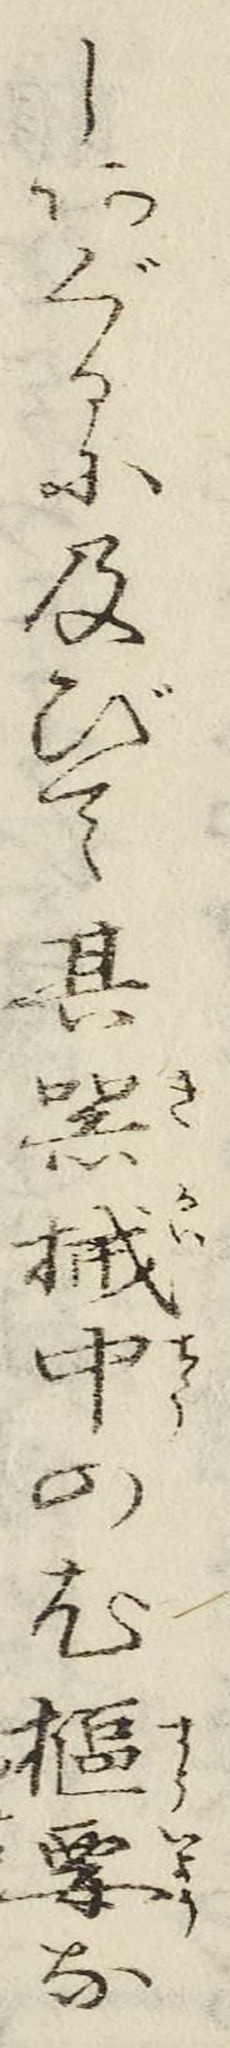しあぐるに及びて其器械中の尤枢要な
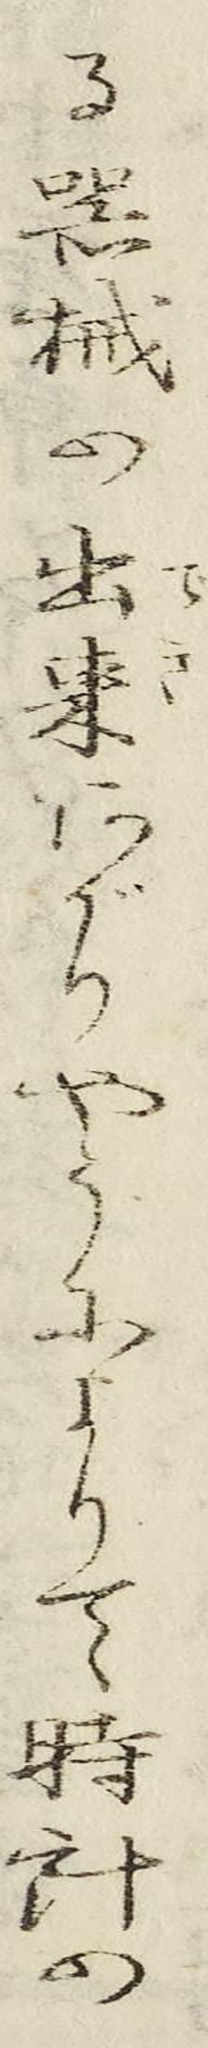る器械の出来あがりやうによりて時計の
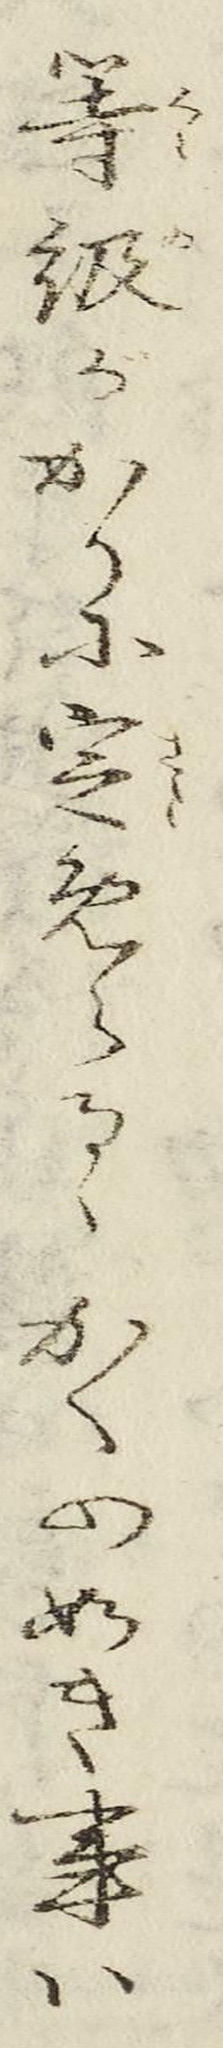等級かかりに定めらるゝかくの如き事は
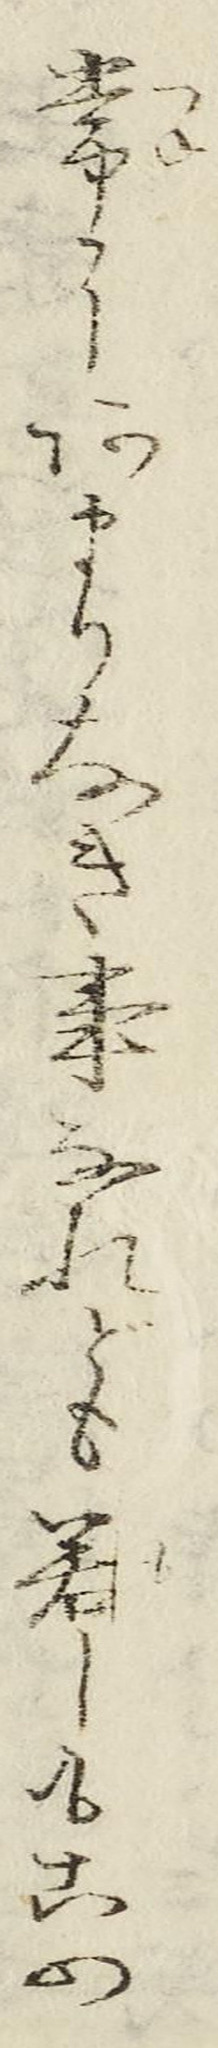常にあまりなき事なれども若しもこの
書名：[時計に関する冊子]
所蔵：東京大学地震研究所図書室 Earthquake Research Institute Library, The University of Tokyo, JAPAN
